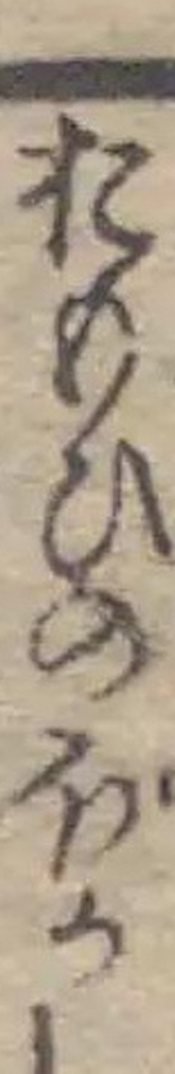おもひのほか
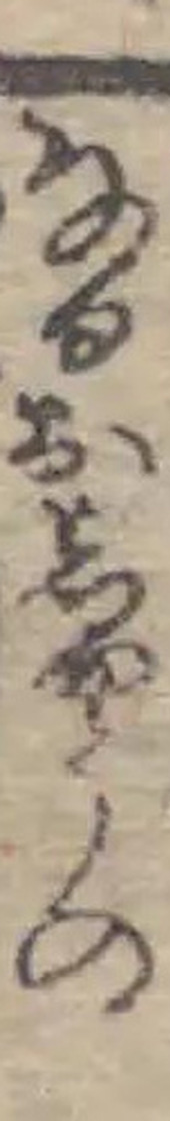なるおしやうの
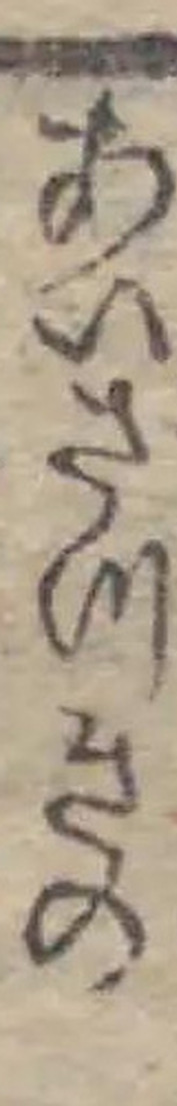あいさつきの
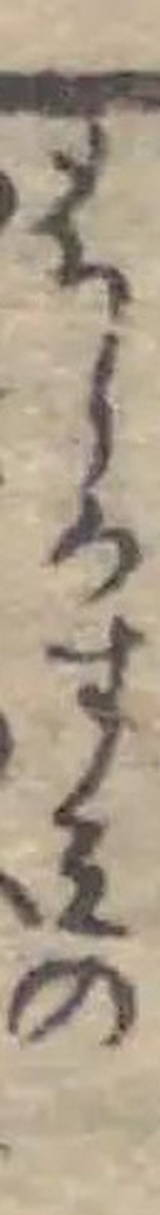はしかすみの
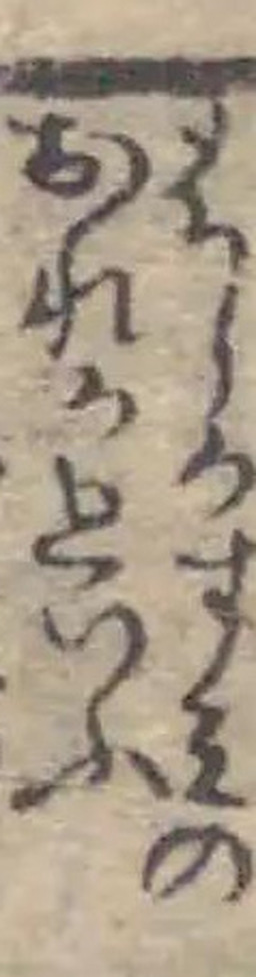おれかといふ
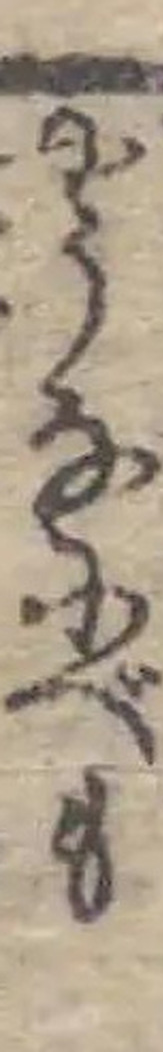やうなにべも
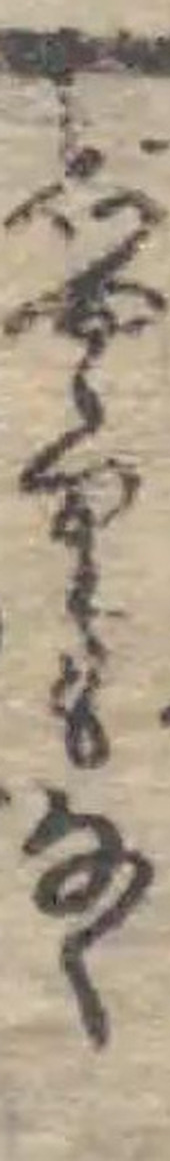しやうりもなく
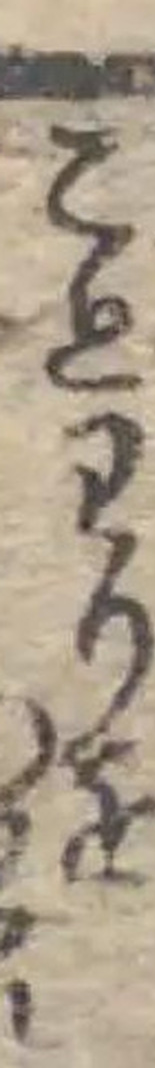ことわりを
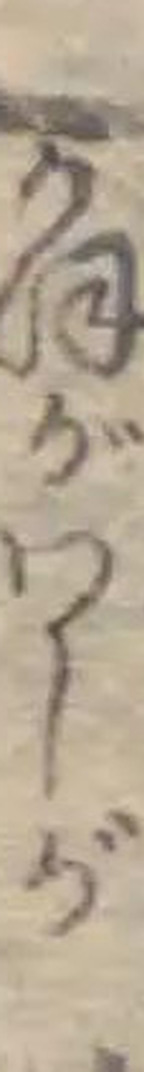かほがわしが
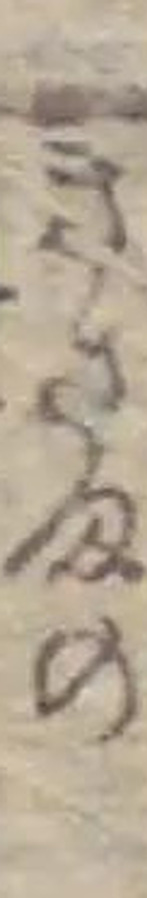きさまの
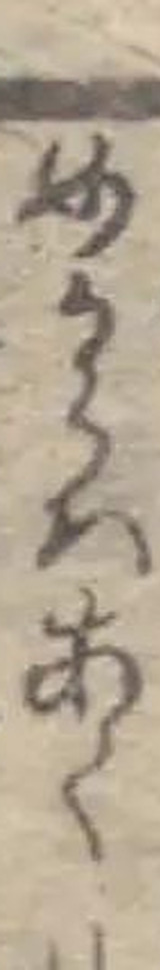めからはあく
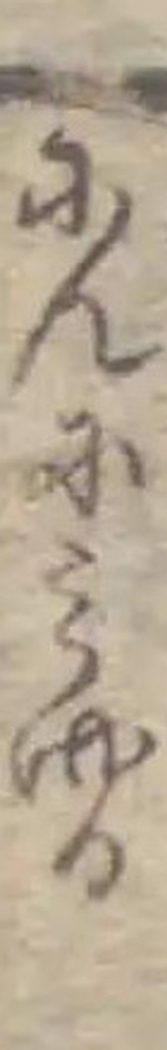にんにみゆる
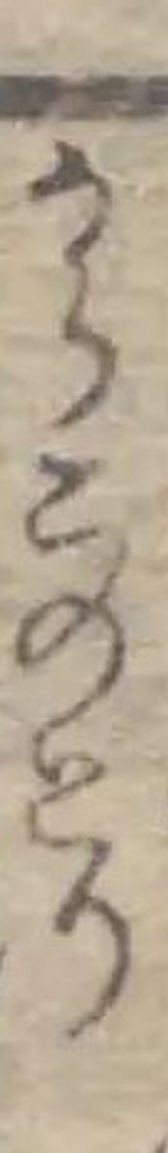からこのとり
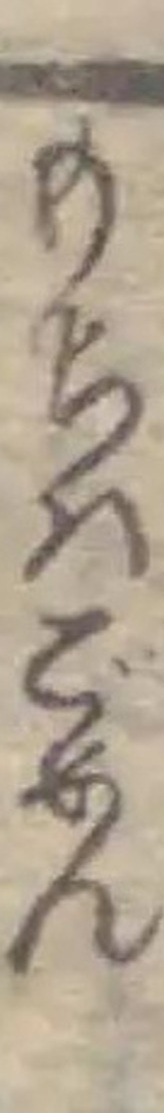もちはごめん
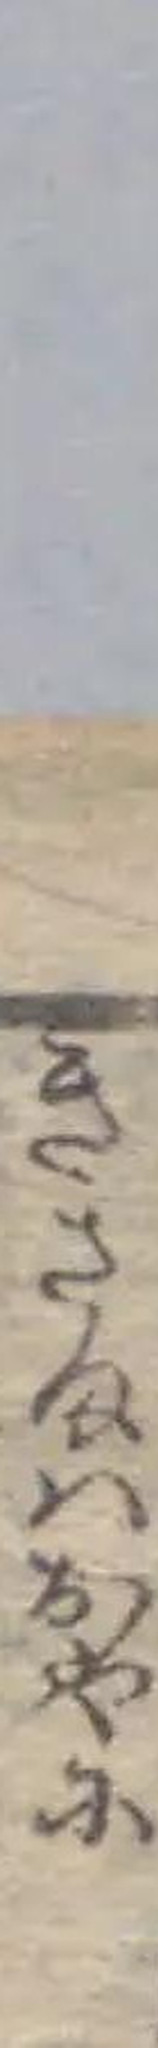きさまはおやに
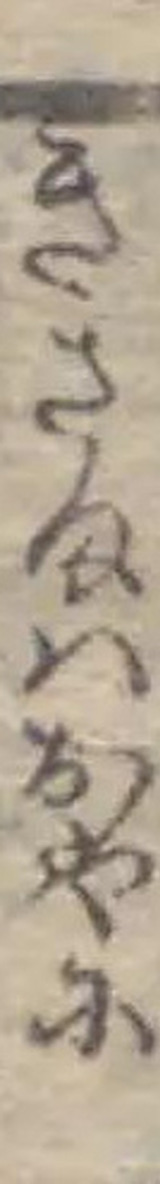きさまはおやに
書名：福壽海旡量品玉 3巻
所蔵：国立国会図書館 National Diet Library, JAPAN
